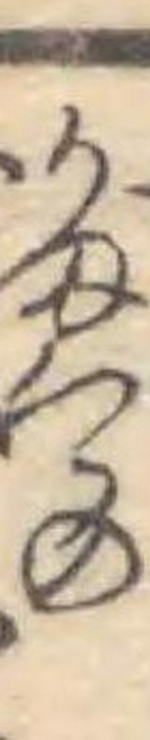かまくらの
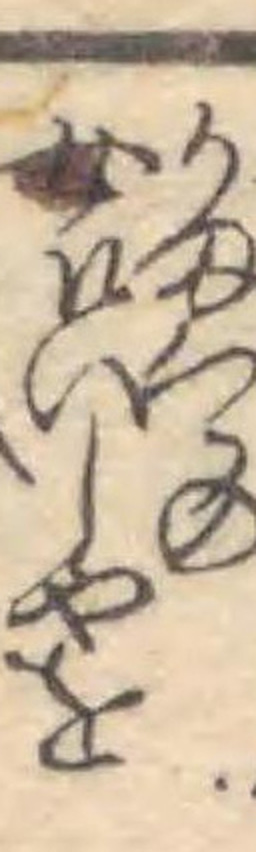女けいしやを
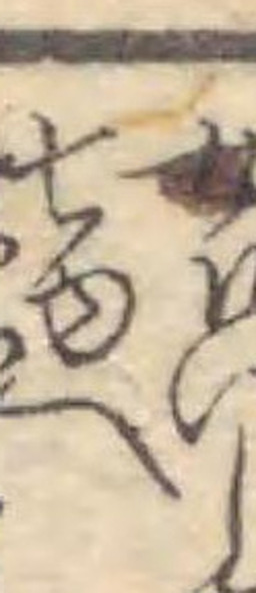七ゆへ
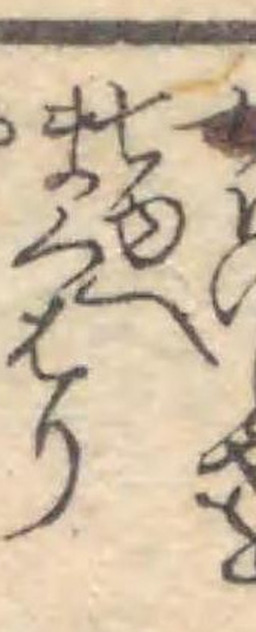まくはり
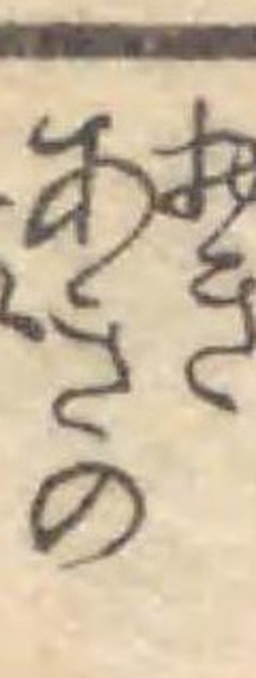あきの
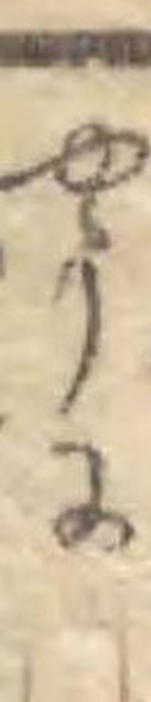やうに
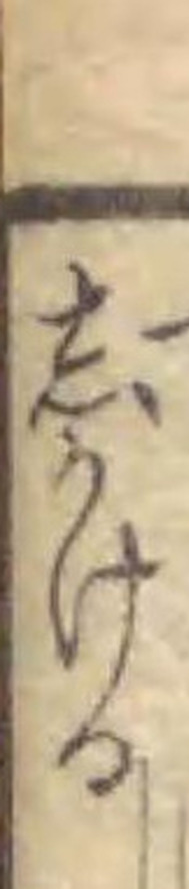しかける
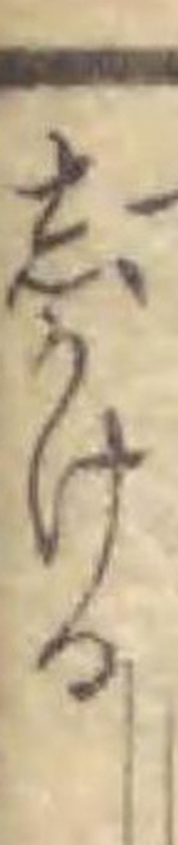しかける
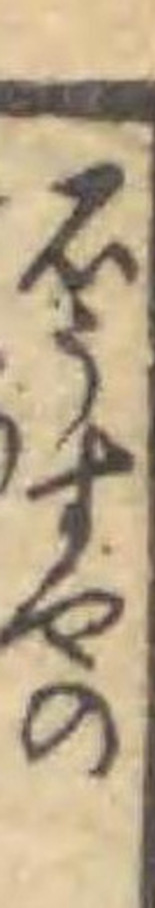石うすやの
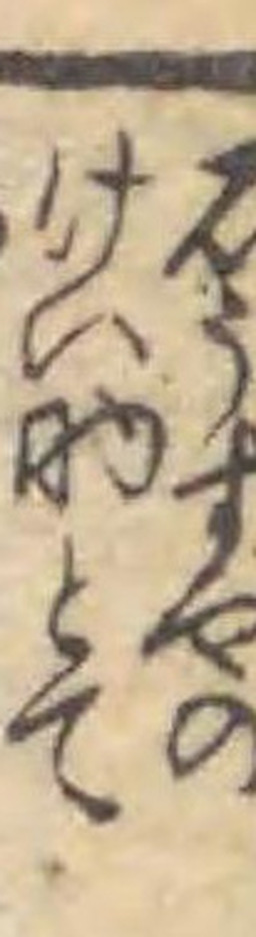けい助とて
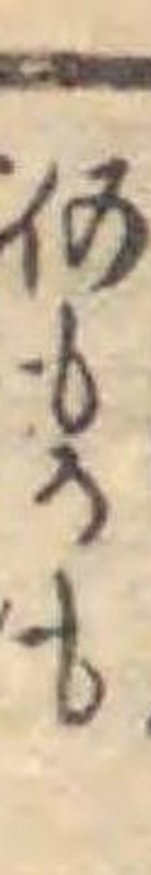何もかも
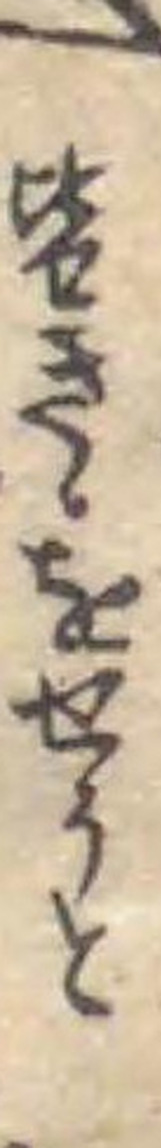皆きゝをせうと
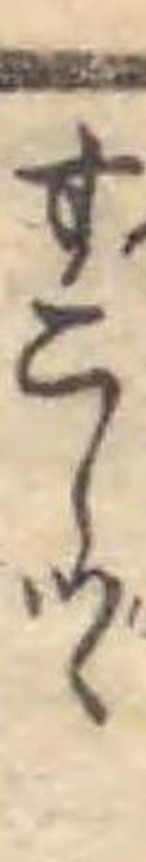すこしつゝ
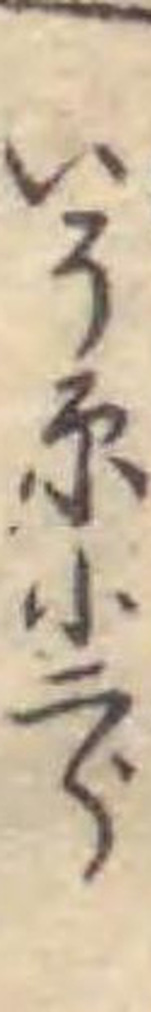いう原小次郎
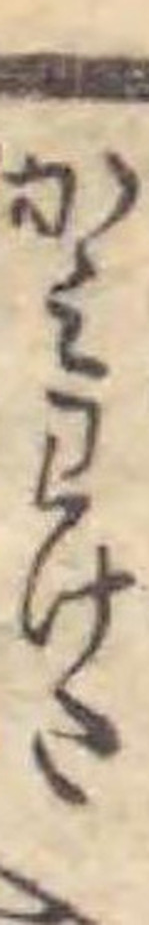かみわけた
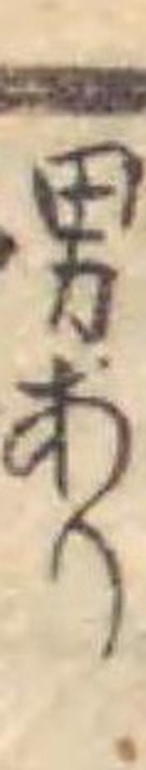男あり
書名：文武二道万石通 : 3巻
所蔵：国立国会図書館 National Diet Library, JAPAN
